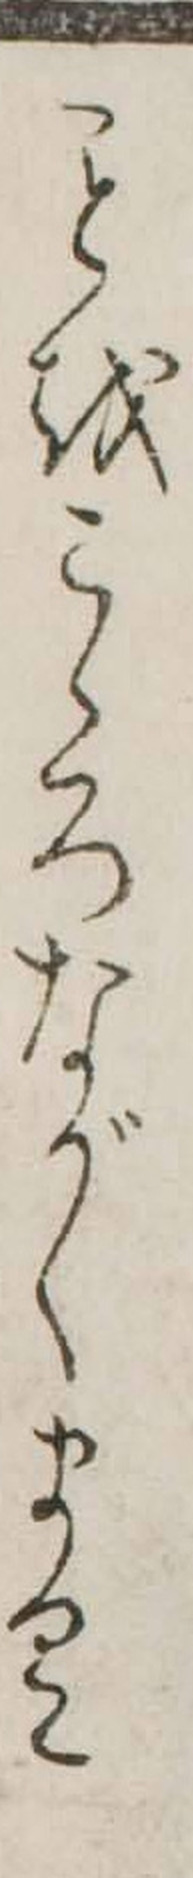ことをこゝろながくまく
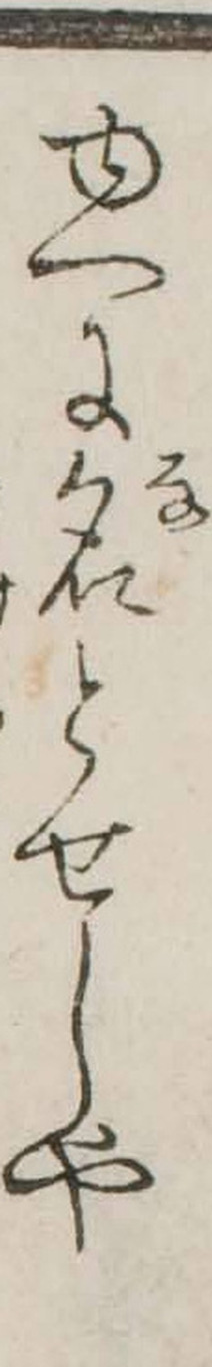ゆへに名とせしや
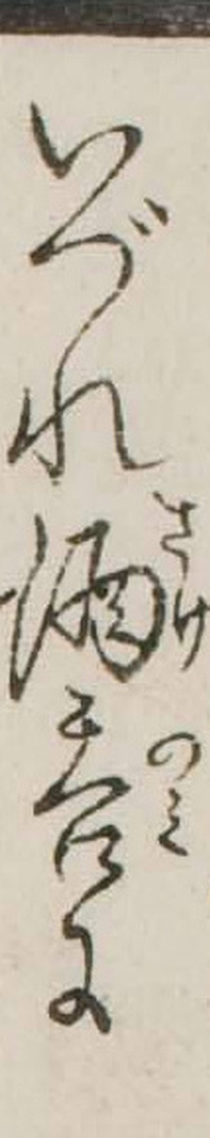いづれ酒呑に
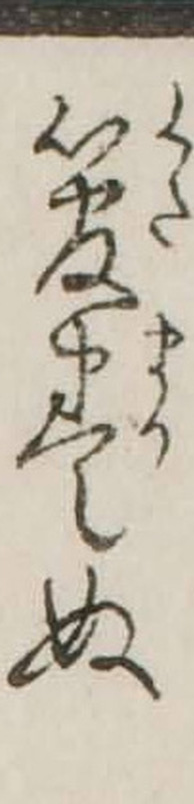管巻ぬ
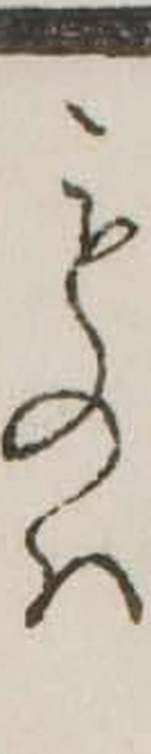ものは
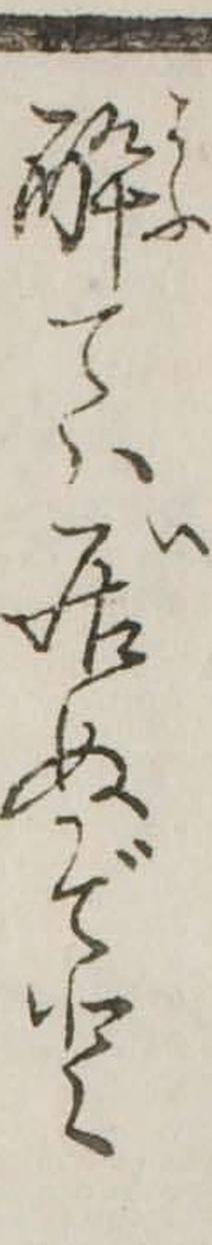酔ては居ぬぞと
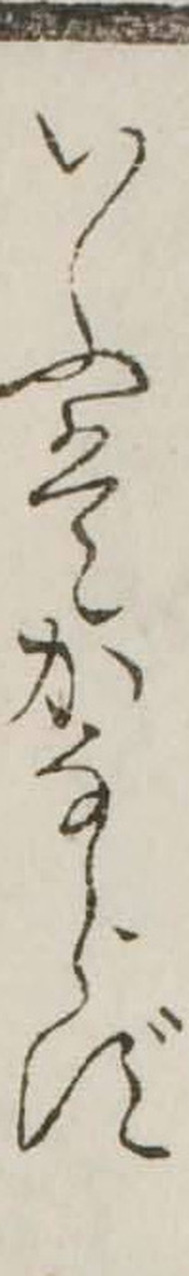いふはかならず
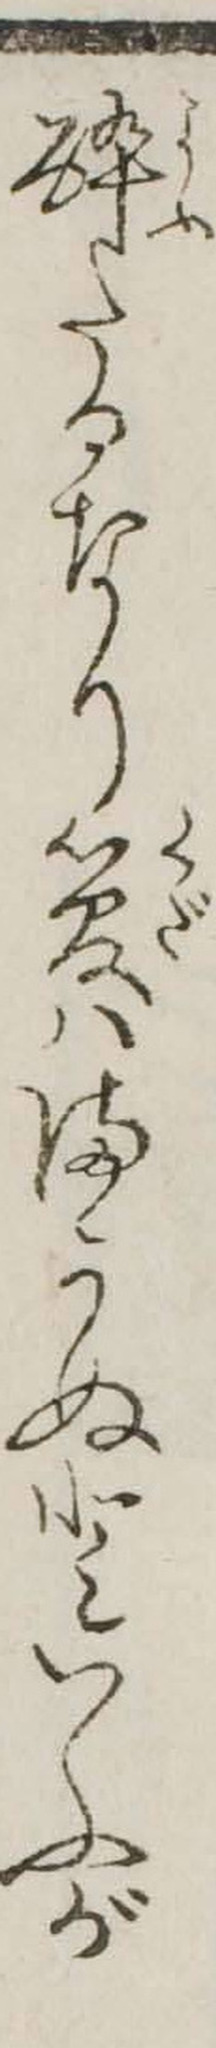酔たるなり管はまかぬといふが
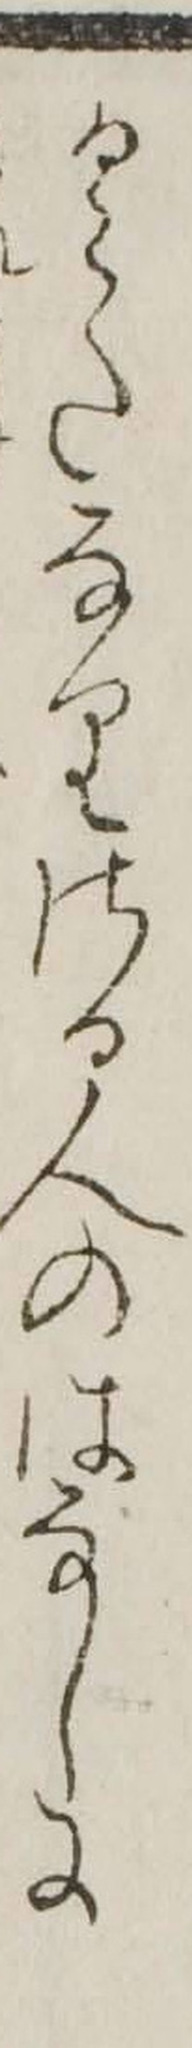くたなりさる人のはなしに
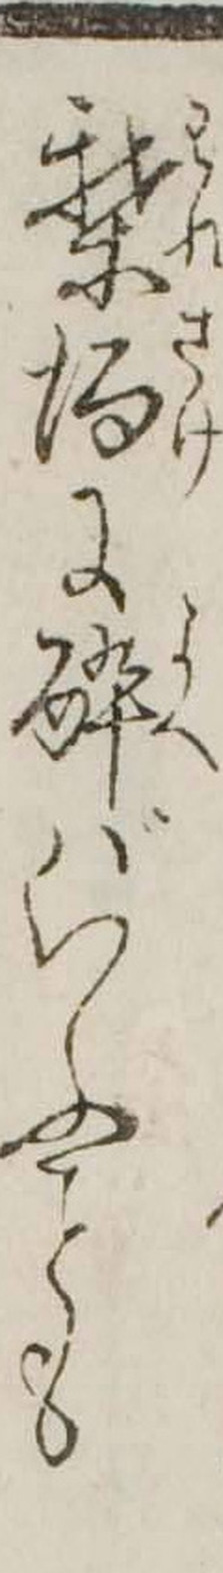我酒に酔ばいふことも
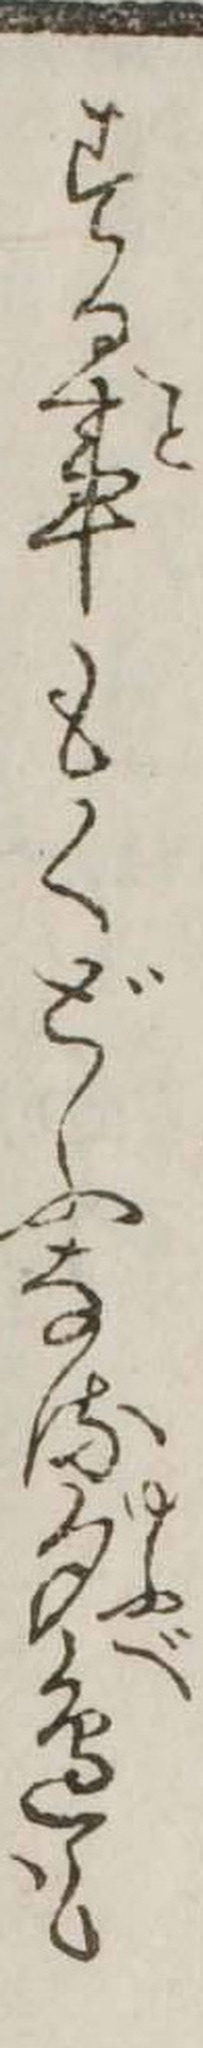する事もくどふなる夕辺も
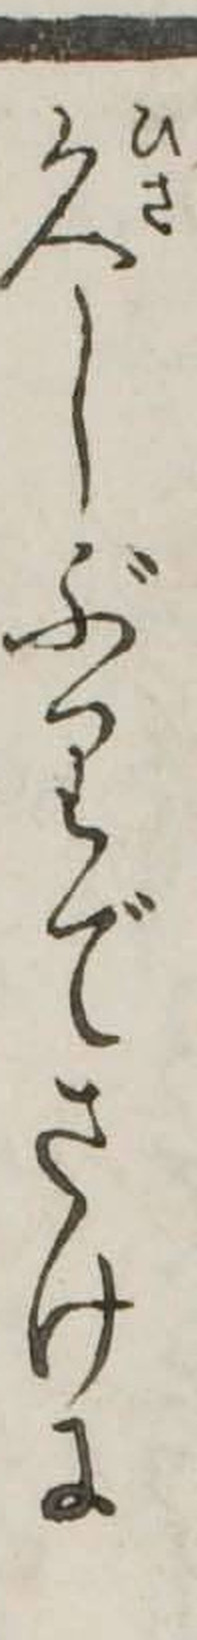久しぶりでさけに
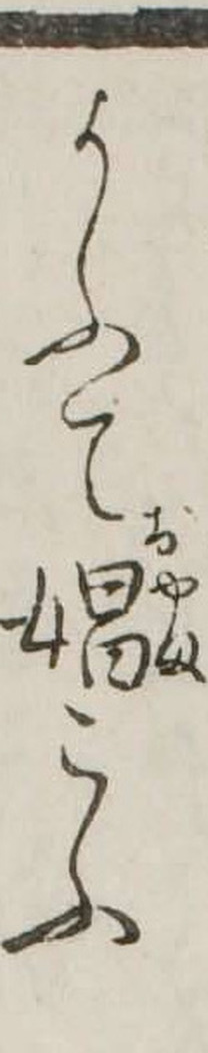よふて娼こふ
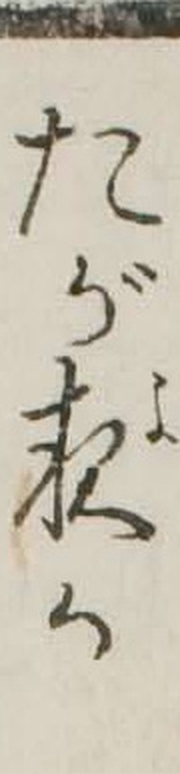たが夜か
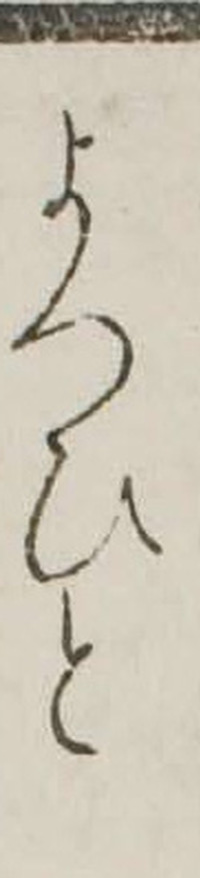よつひと
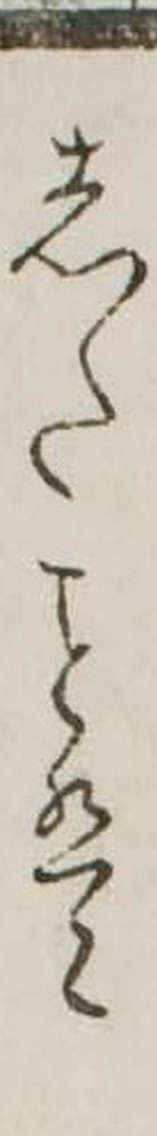したことは
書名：繪本不盡泉
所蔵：国文学研究資料館
